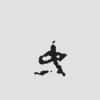女
